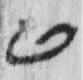㠯（以）
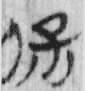保
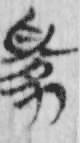○（家）
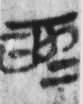爲
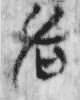左
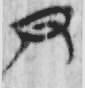尹
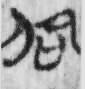卲
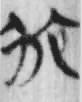{力它}
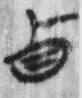貞
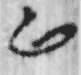㠯（以）
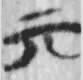亓（其）
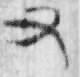又（有）
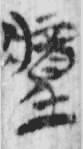○（瘇）
